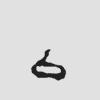㠯（以）
